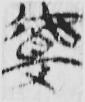○（且）
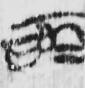爲
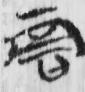巫
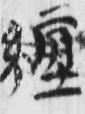綳
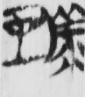○（佩）
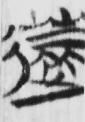速
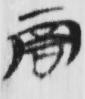巫
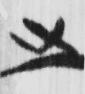之
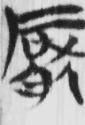厭
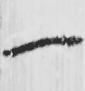一
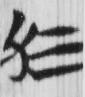於
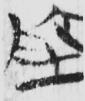○（地）
